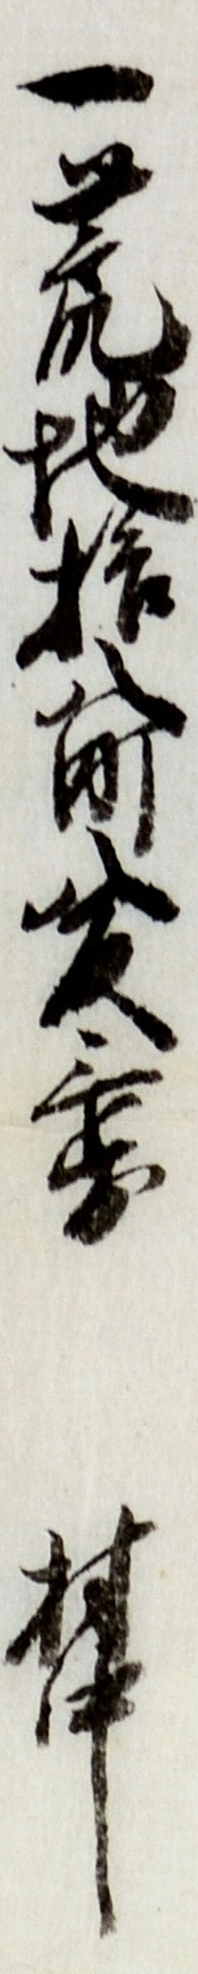一荒地拾八町八反歩村中
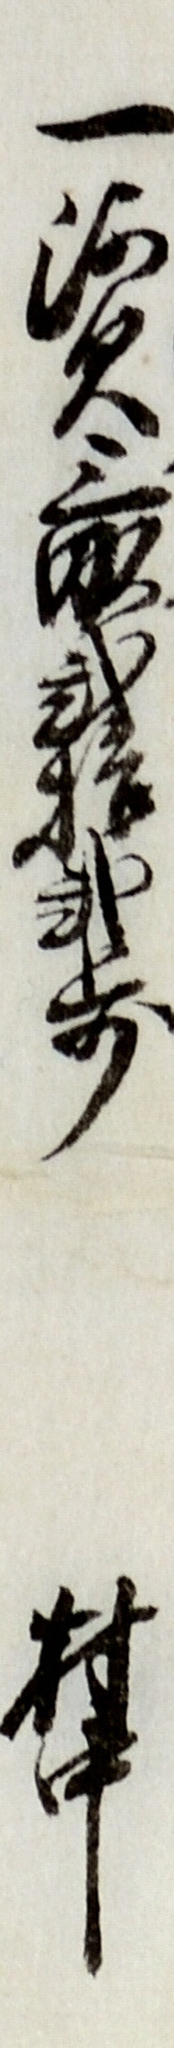一河欠三畝弐拾弐歩村中
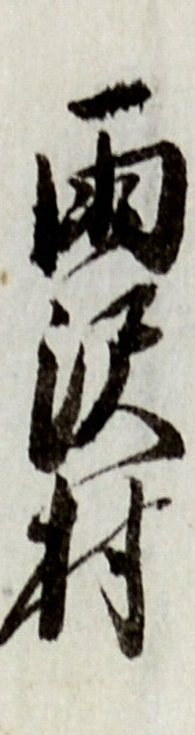雨沢村
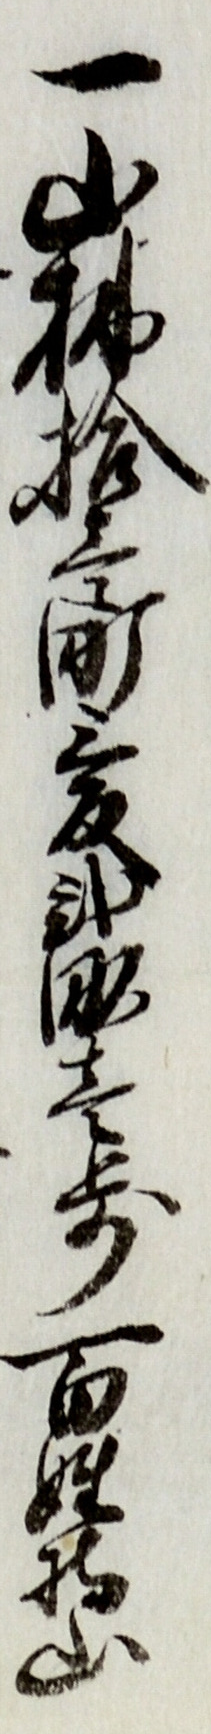一山林拾壱町三反弐畝壱歩百姓持山
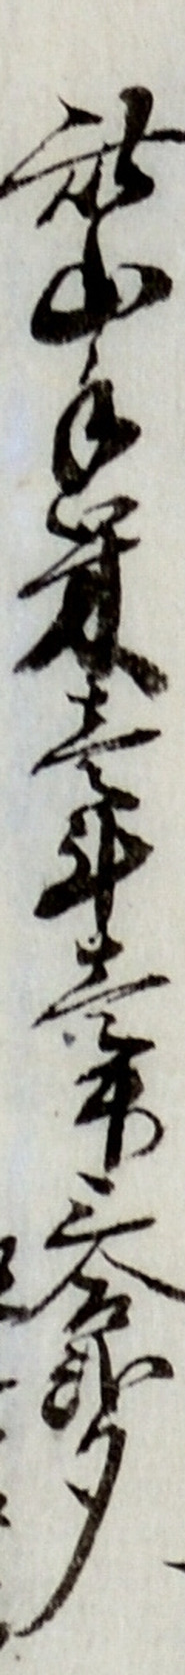此山手米壱斗壱升三合弐勺
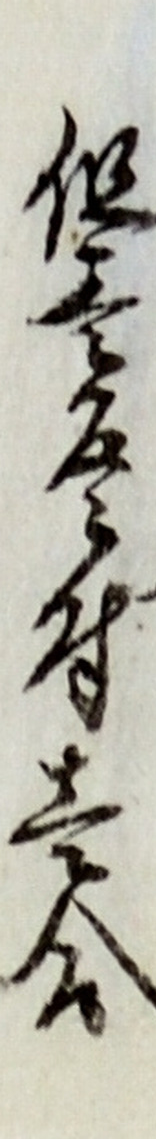但壱反ニ付壱合

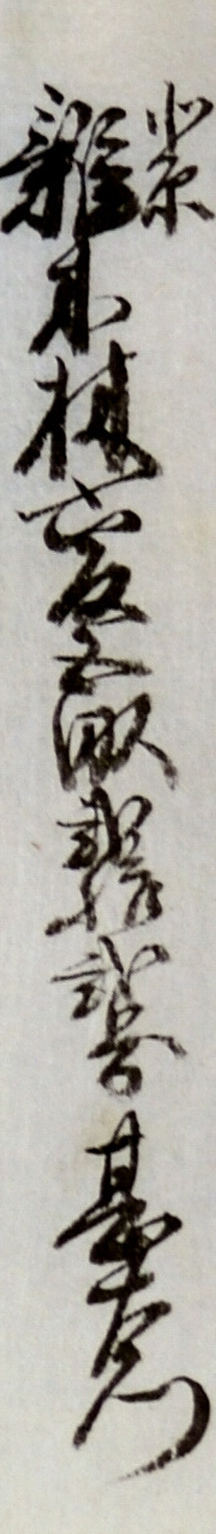雑木林六反五畝弐拾弐歩甚右衛門
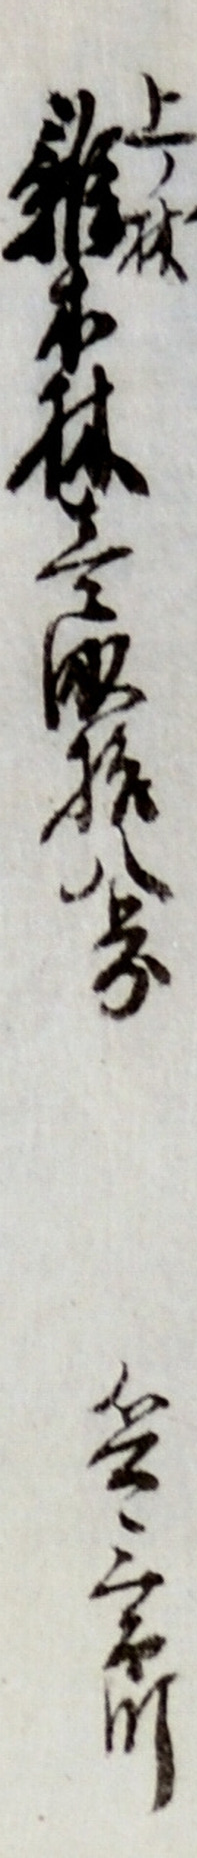雑木林壱畝拾八歩兵三郎
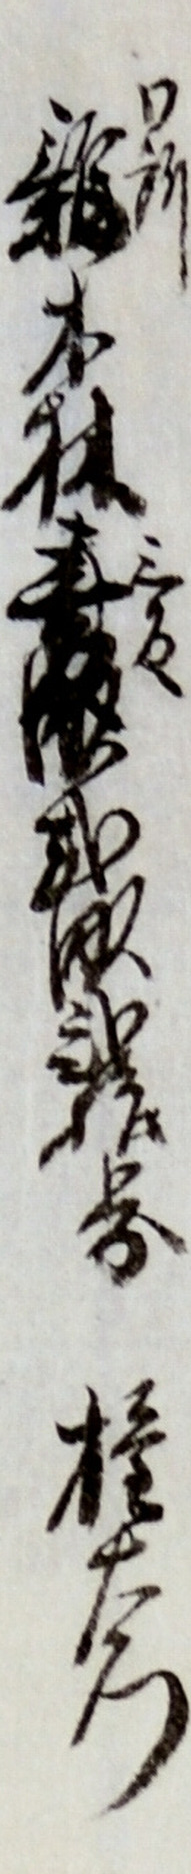雑木林三反弐畝弐拾歩権右衛門
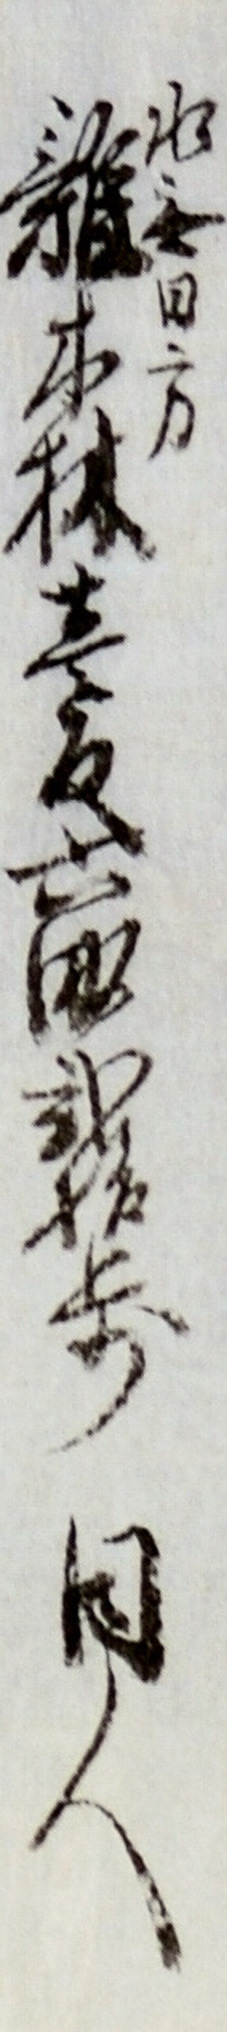雑木林壱反六畝弐拾歩同人
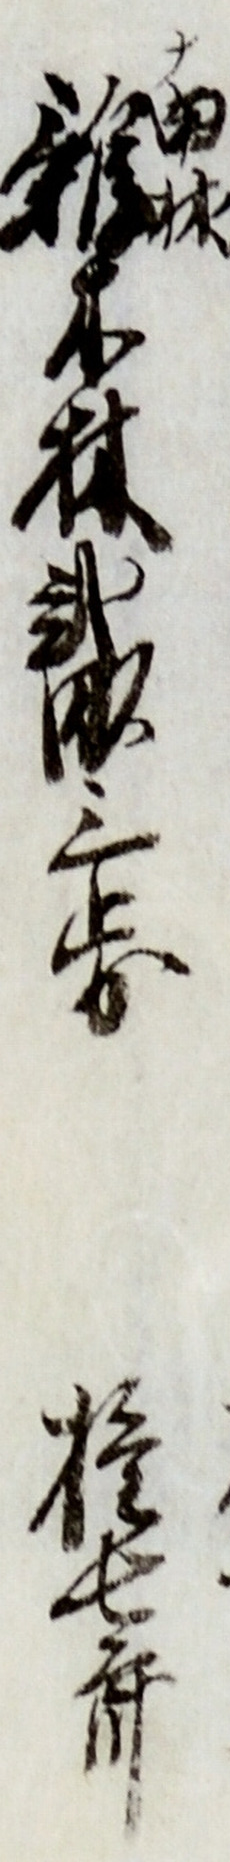雑木林弐畝三歩権七郎
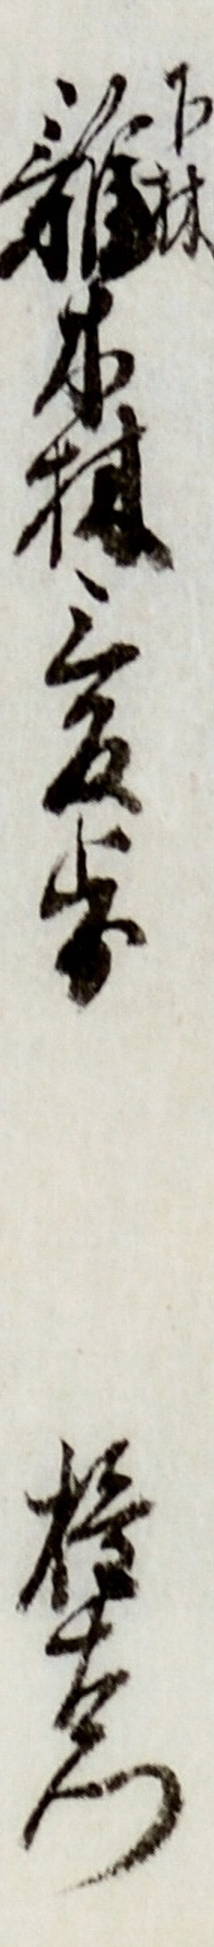雑木林三反歩権右衛門
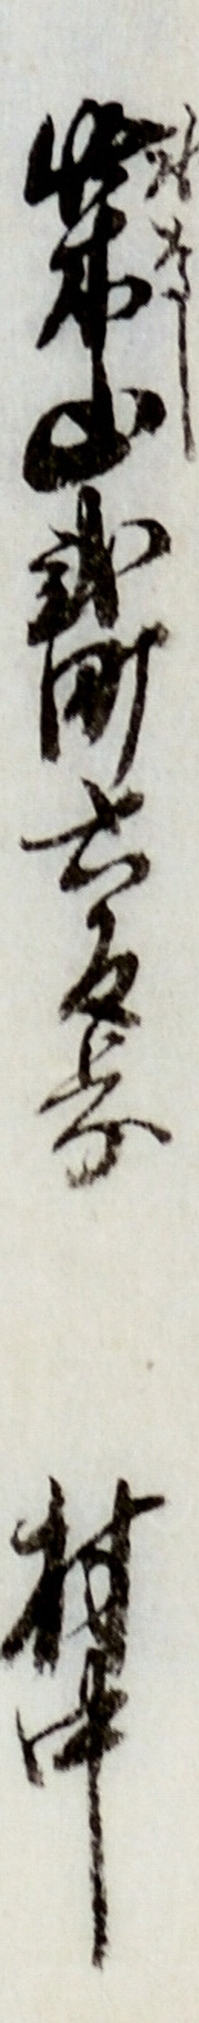柴山弐町六反歩村中
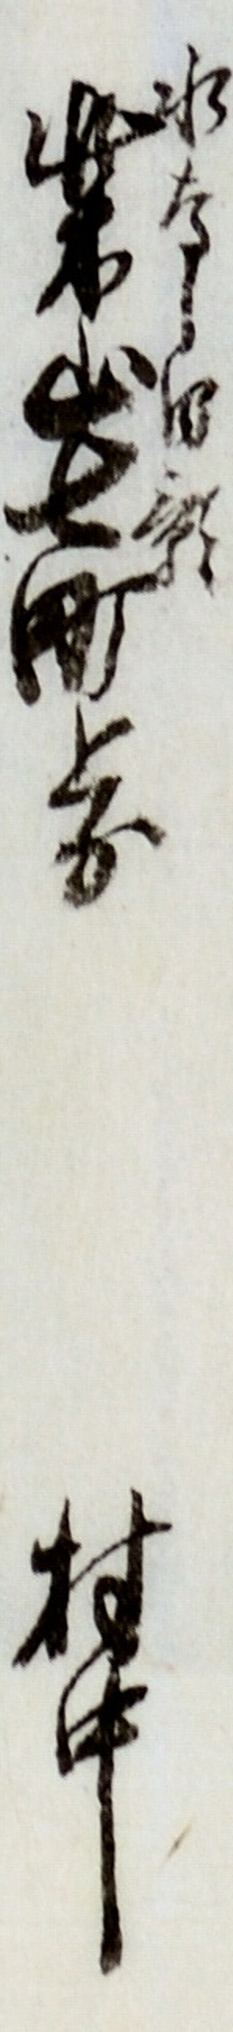柴山七町歩村中
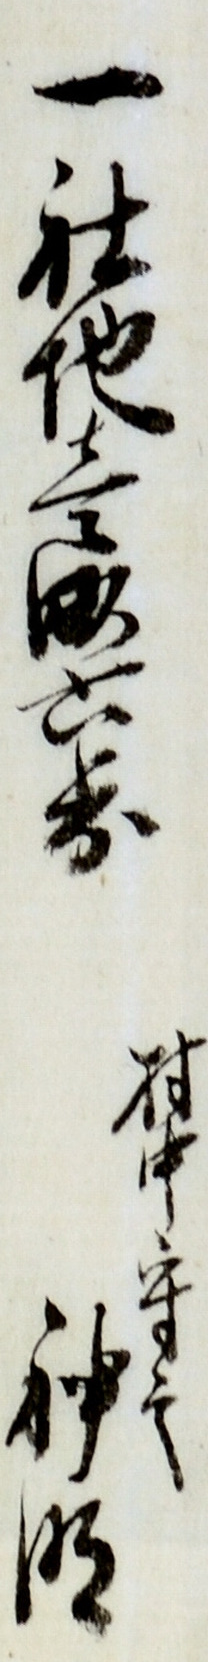一社地壱畝六歩神明
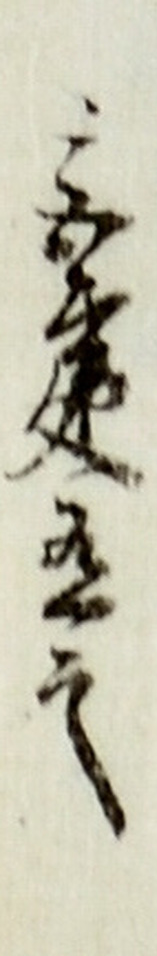宮建有之
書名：御領分中山林社地手控
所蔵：伊那市立高遠町図書館・合同会社AMANE
